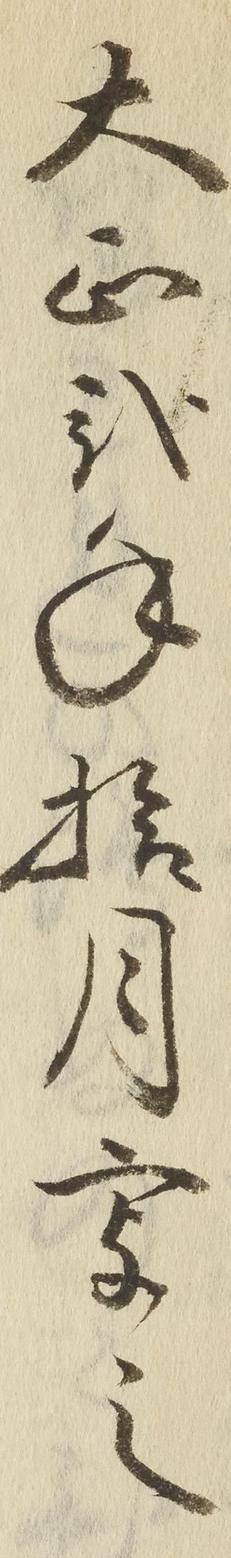大正弐年拾月写之
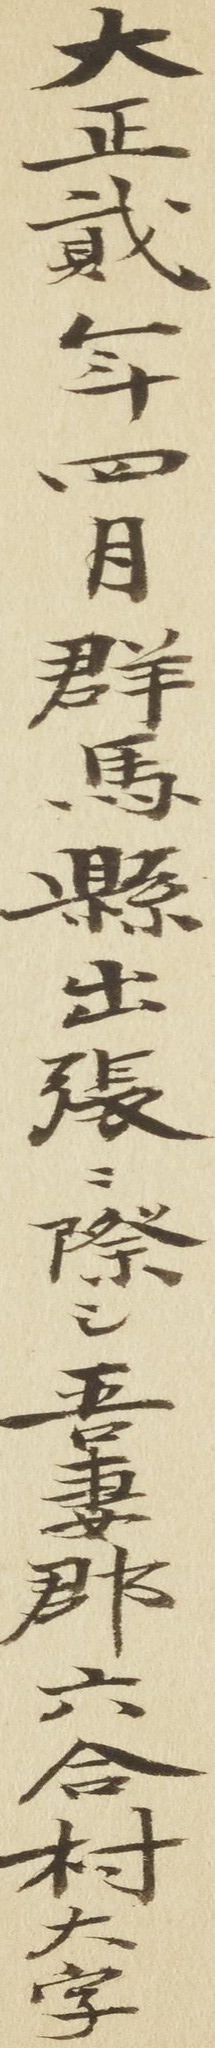大正弐年四月群馬県出張二際シ吾妻郡六合村大字
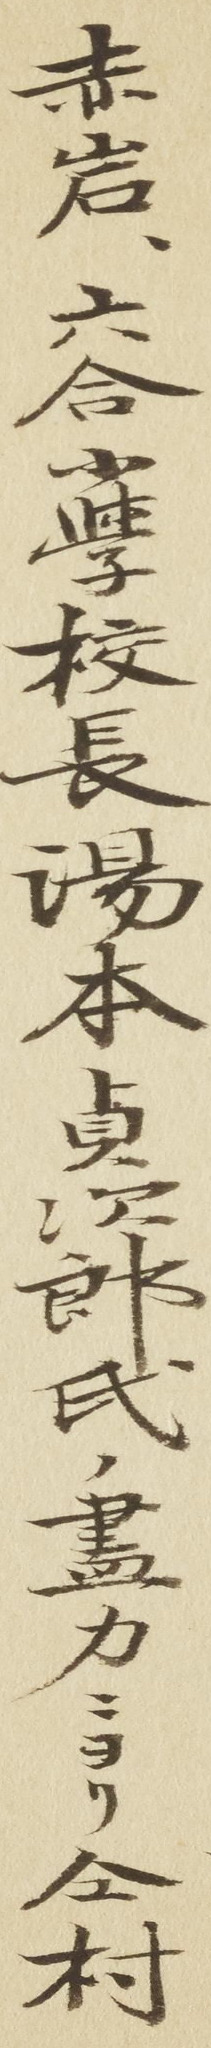赤岩、六合小学校長湯本貞次郎氏ノ尽力二ヨリ同村
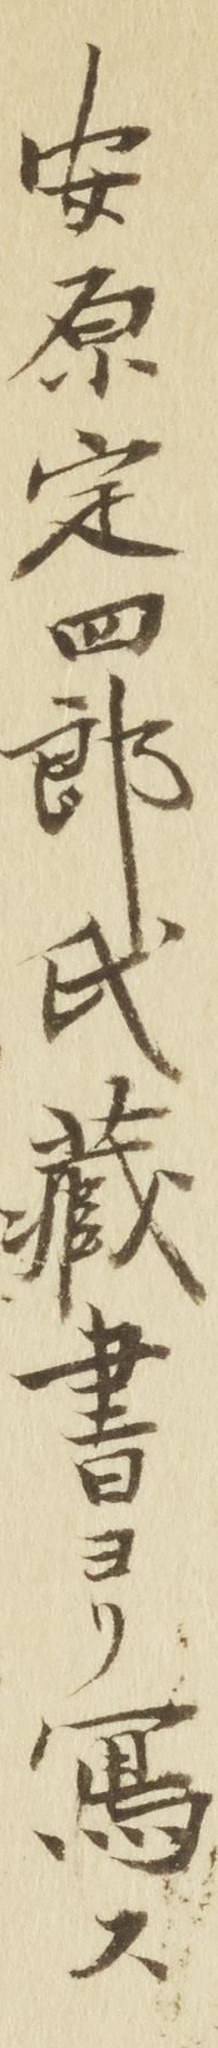安原定四郎氏蔵書ヨリ写ㇲ
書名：浅間大變記
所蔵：東京大学地震研究所図書室 Earthquake Research Institute Library, The University of Tokyo, JAPAN
